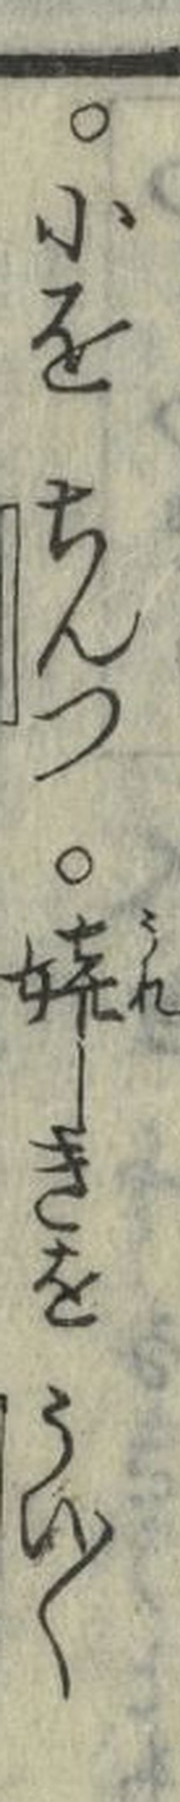○小をちんつ○嬉しきをうい〳〵
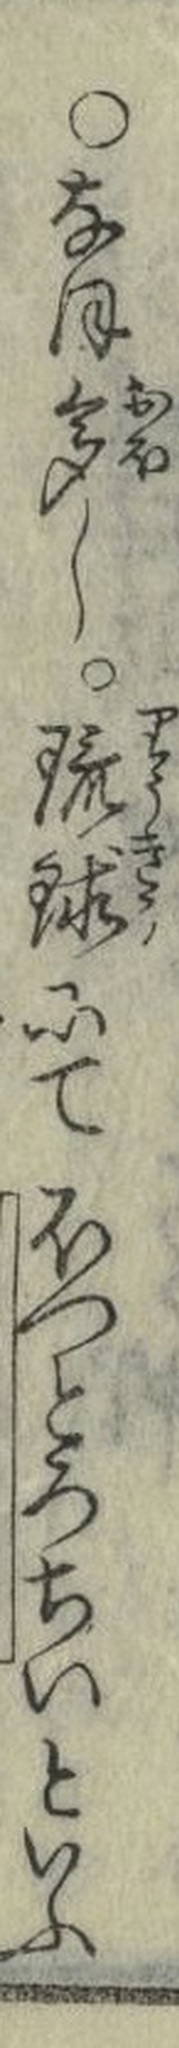○なほ多く。琉球にてふつとろちいといふ
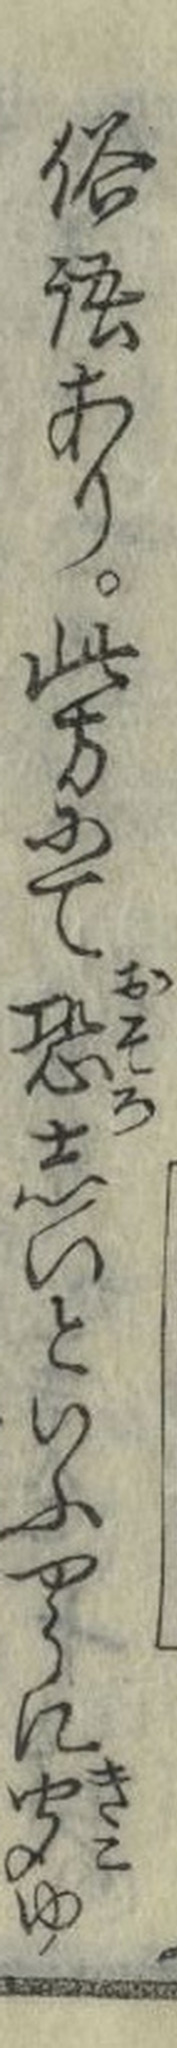俗語あり。此方にて恐しいといふやうに聞ゆ
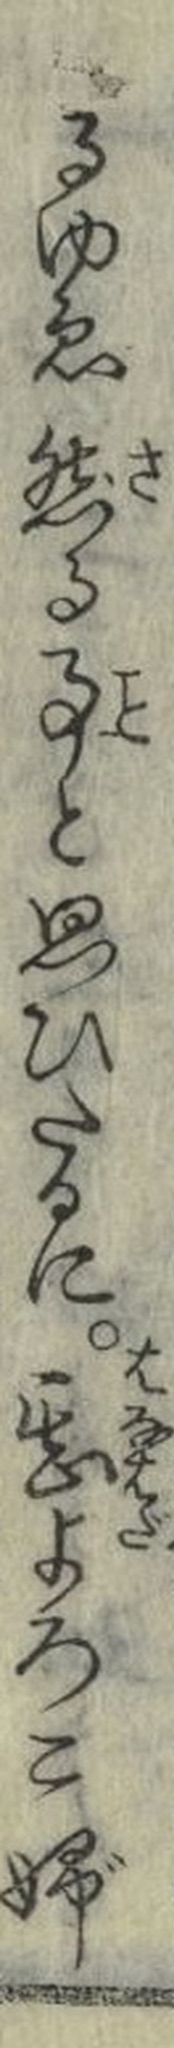るゆゑ然る事と思ひたるに。甚よろこぶ
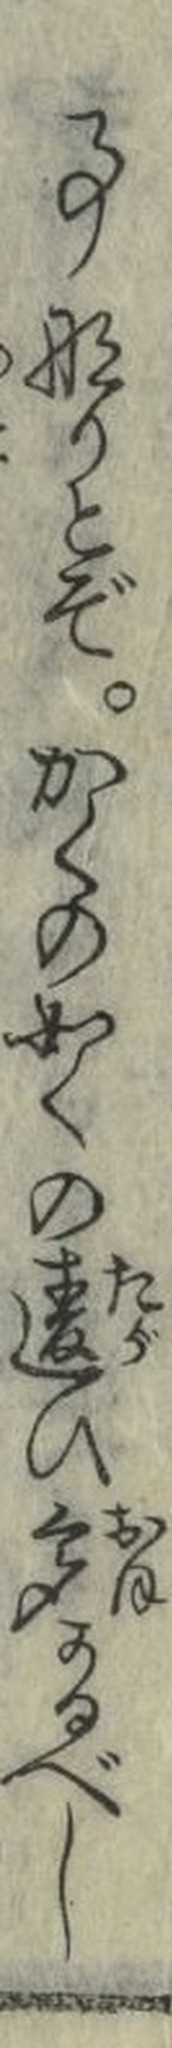事なりとぞ。かくの如くの違ひ多かるべし
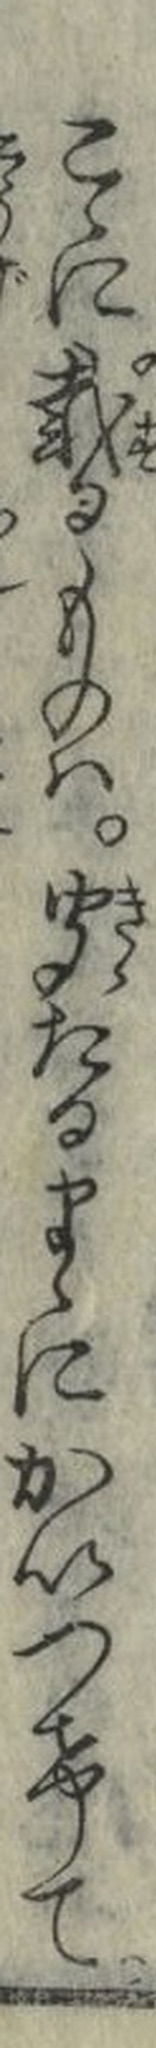こゝに載るものは。聞たるまゝにかいつけて
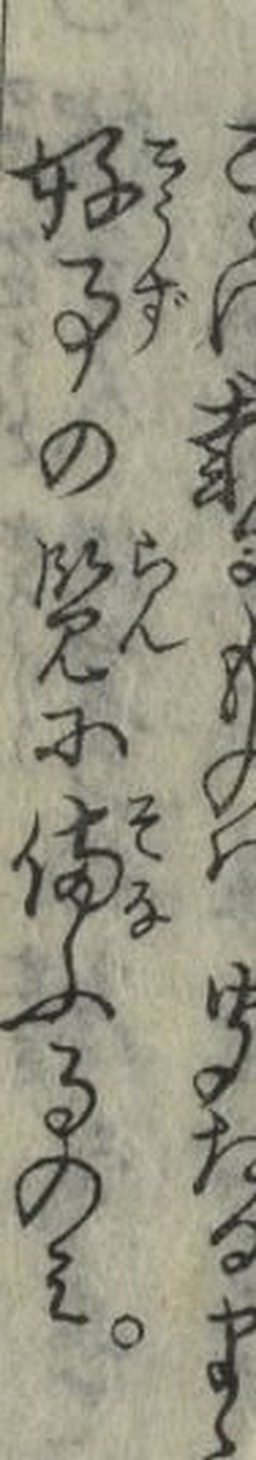好事の覧に備ふるのみ。

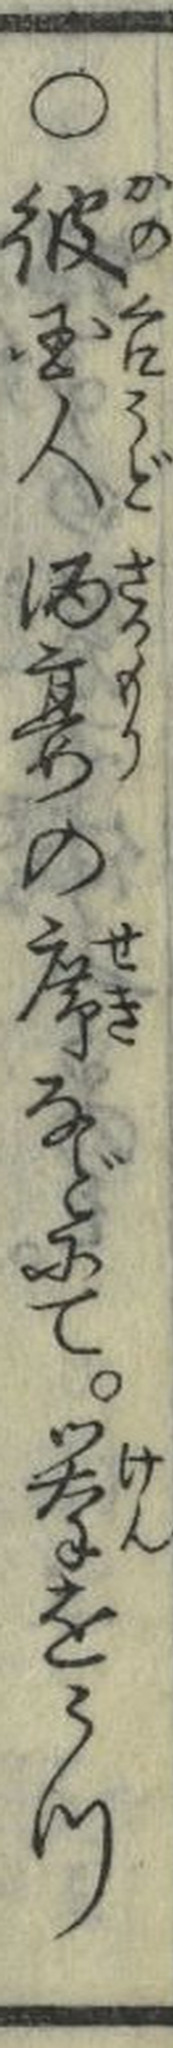○彼国人酒宴の席などにて。拳をうつ
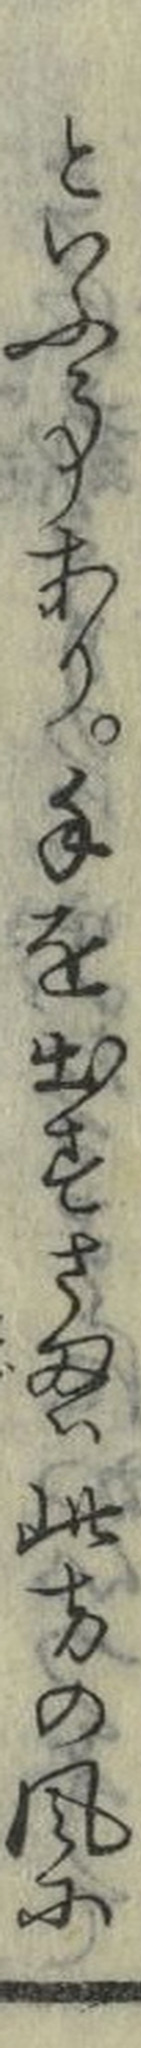といふ事あり。手を出すさまは此方の風に
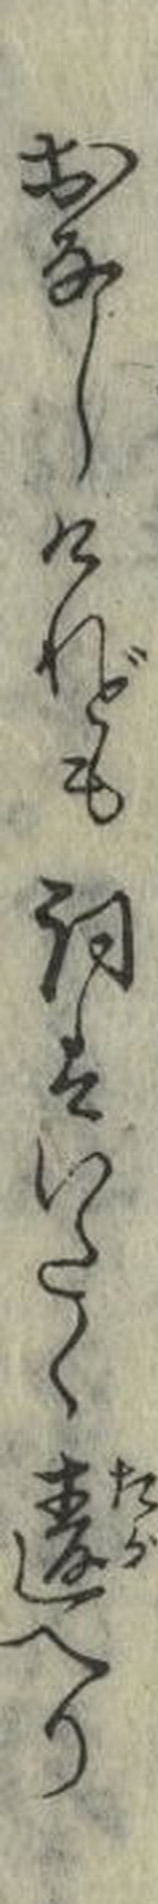おなしけれども詞はいたく違へり
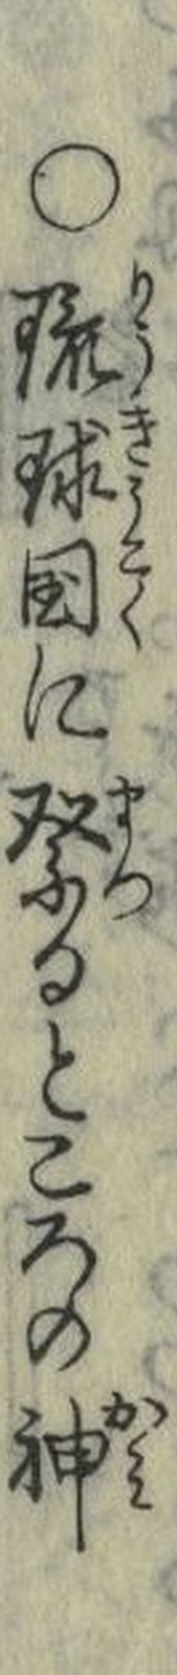○琉球国に祭るところの神
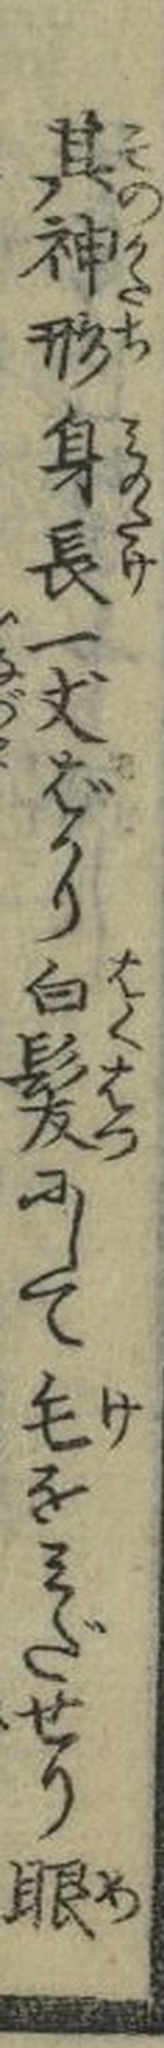其神形身長一丈ばかり白髪にして毛をみだせり眼
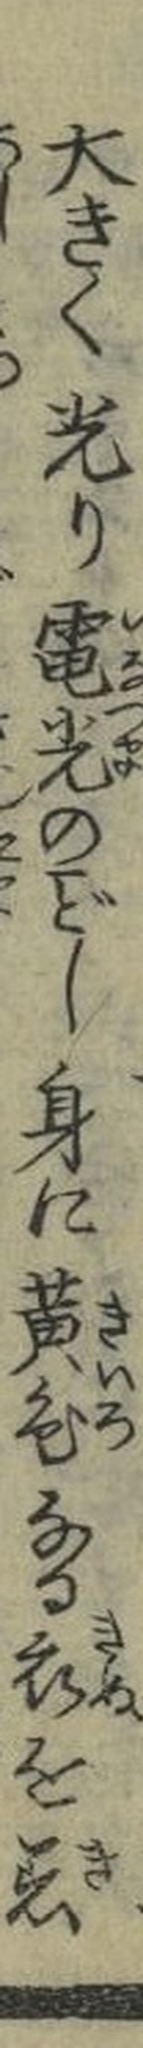大きく光り電光のごとし身に黄色なる衣を着
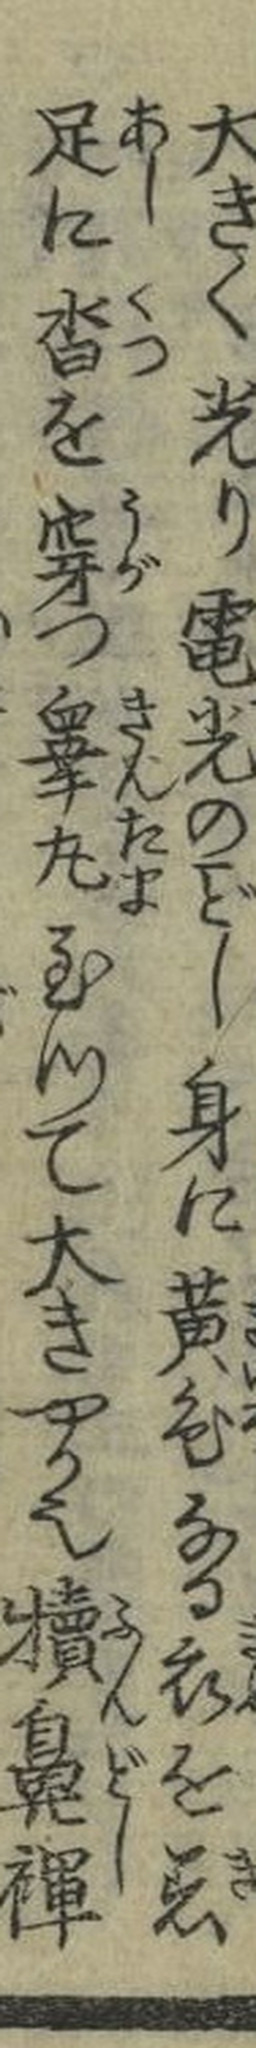足に沓を穿つ睾丸至つて大きやか也犢鼻褌
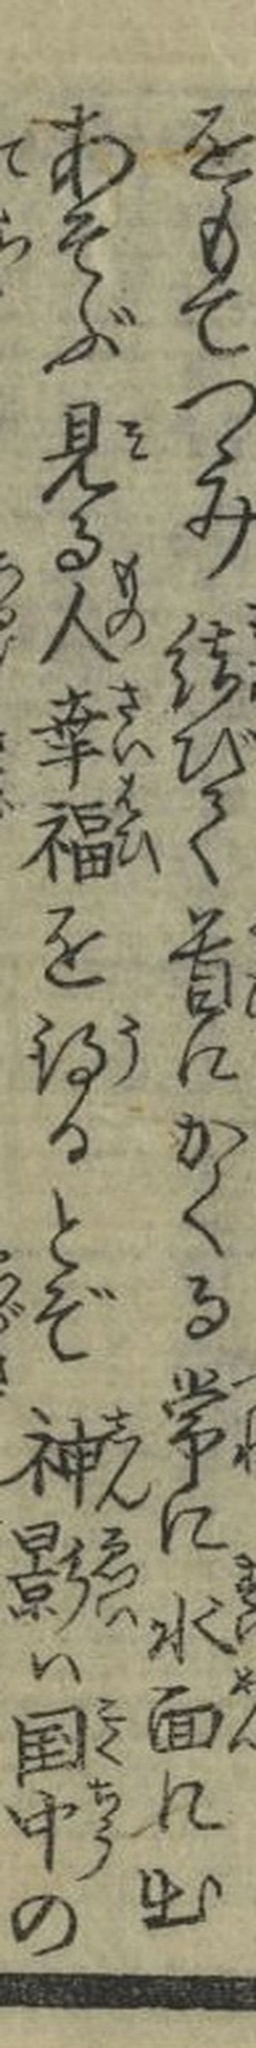をもてつゝみ見る人幸福を得るとぞ神影は国中の
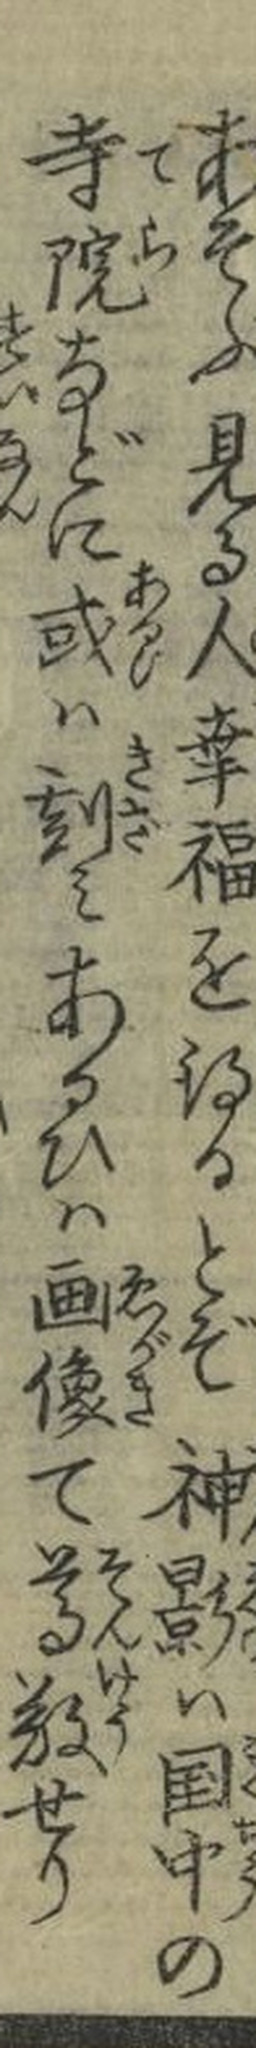寺院などに或は刻みあるひは画像て尊敬せり。
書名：琉球奇譚
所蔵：University of the Ryukyus Library
